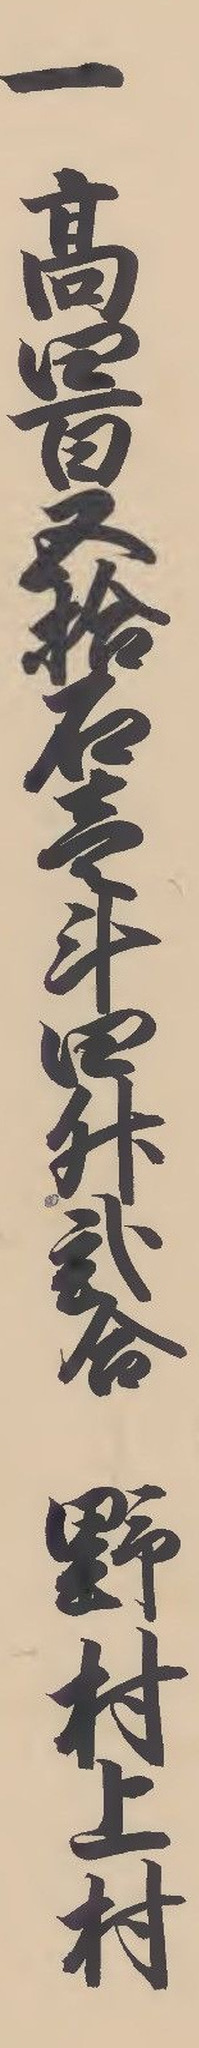一高四百五拾石壱斗四升弐合野村上村

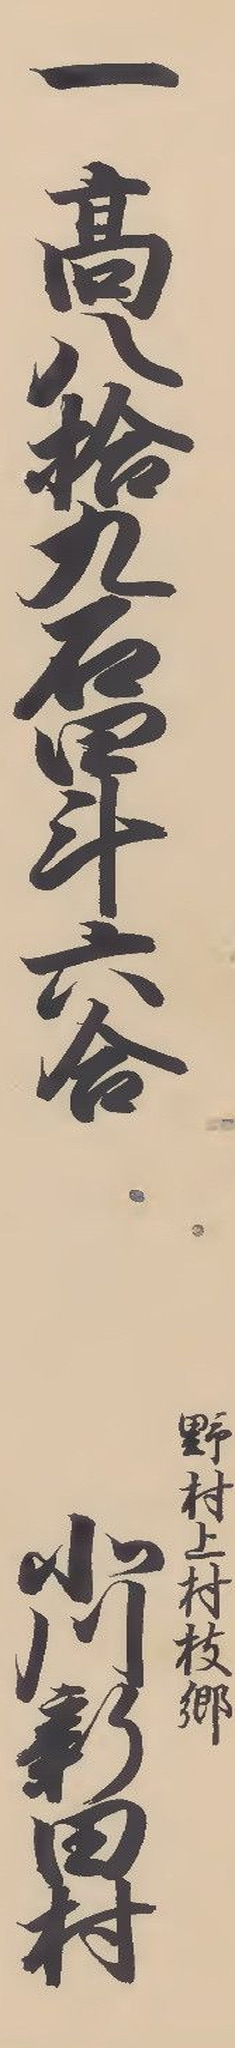一高八拾九石四斗六合北川新田村
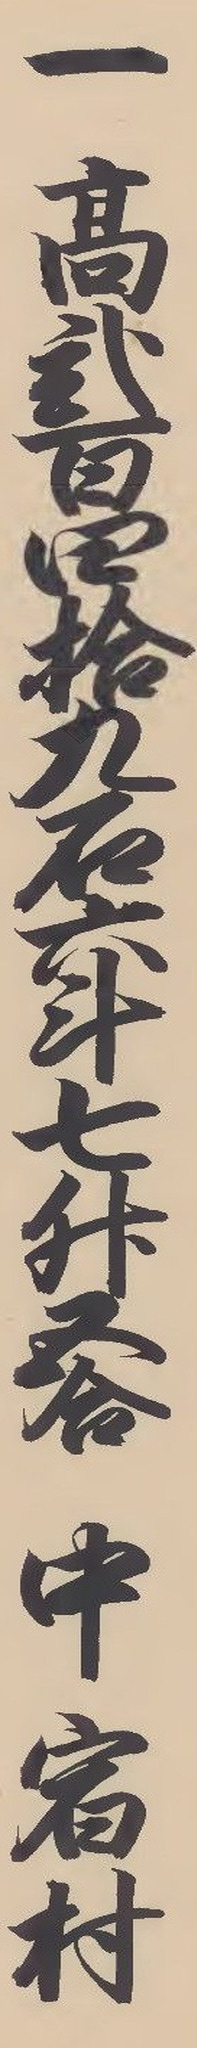一高弐百四拾九石六斗七升五合中宿村
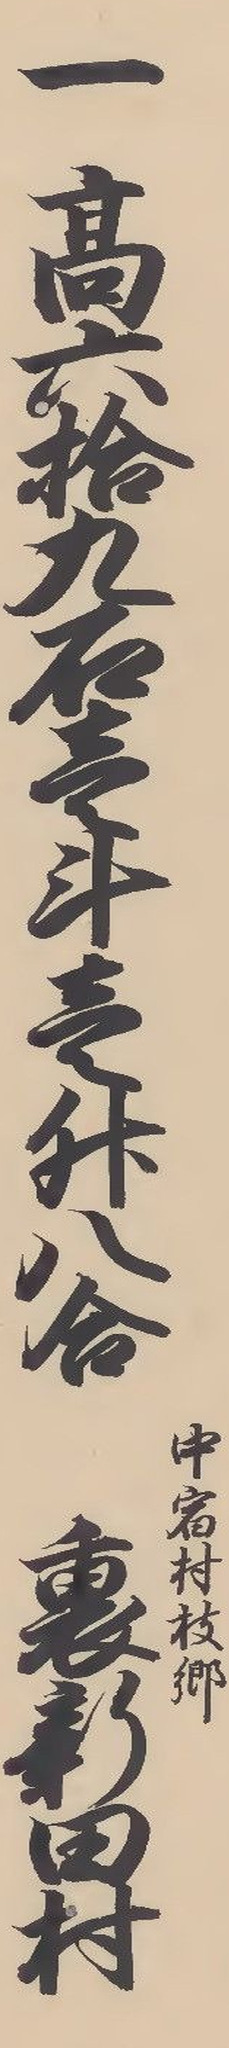一高六拾九石壱斗壱升八合裏新田村
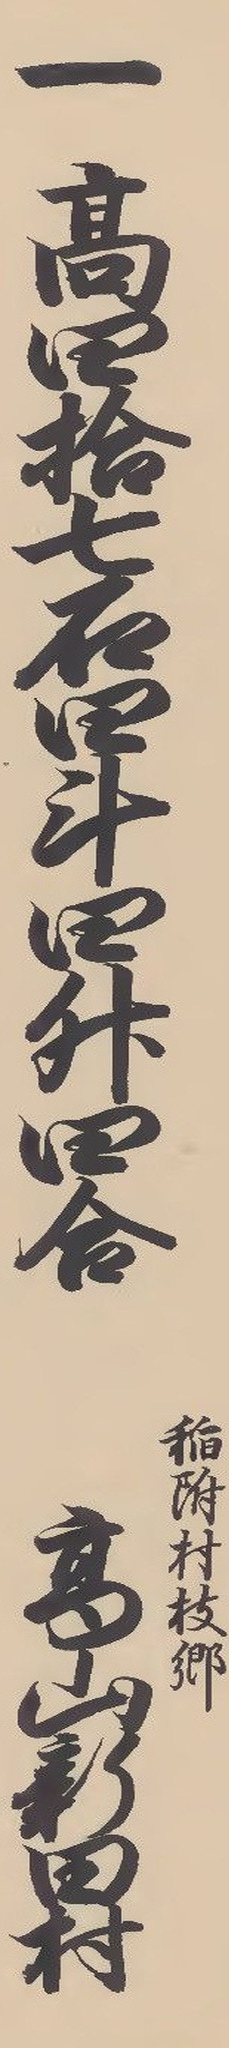一高四拾七石四斗四升四合高山新田村
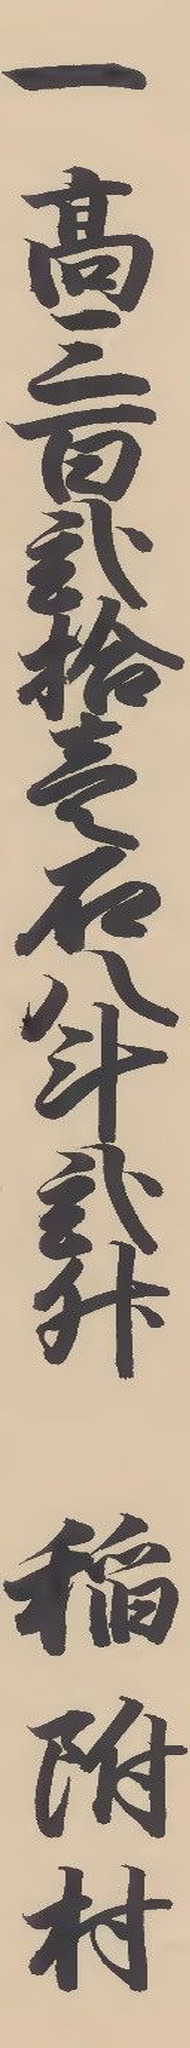一高三百弐拾壱石八斗弐升稲附村
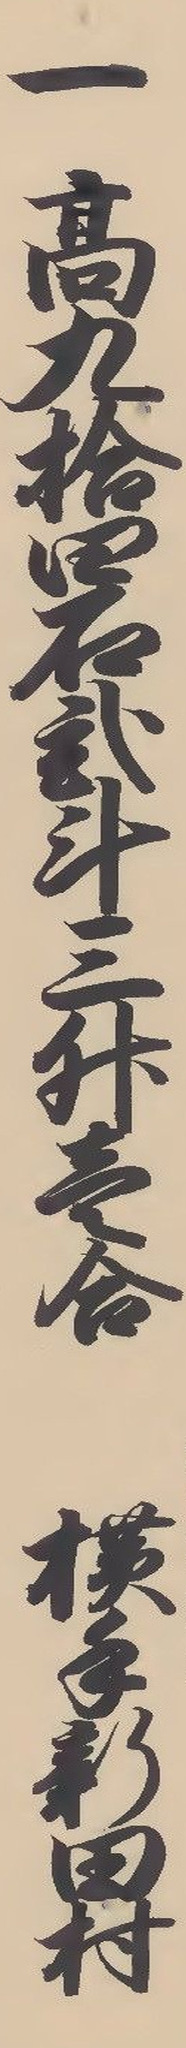一高九拾四石弐斗三升壱合横手新田村
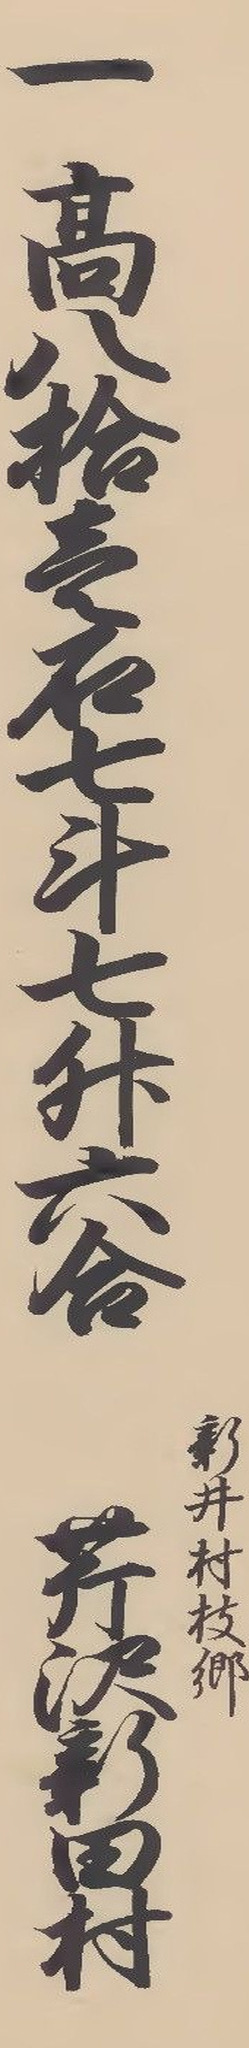一高八拾壱石七斗七升六合芹沢新田村
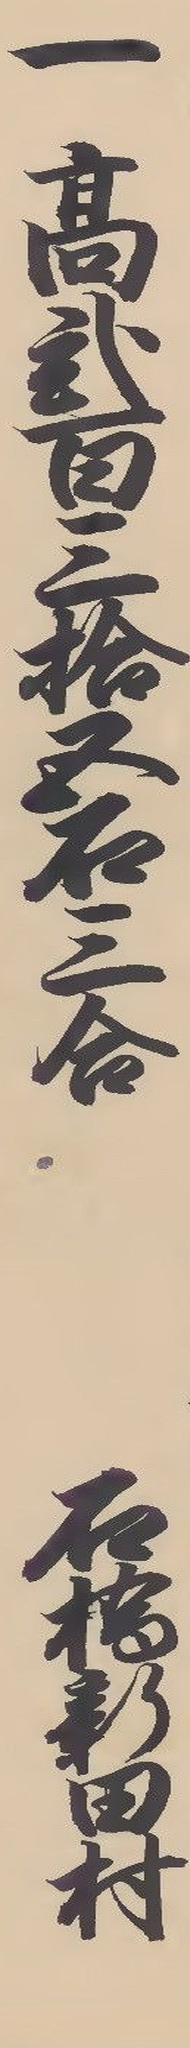一高弐百三拾五石三合石橋新田村

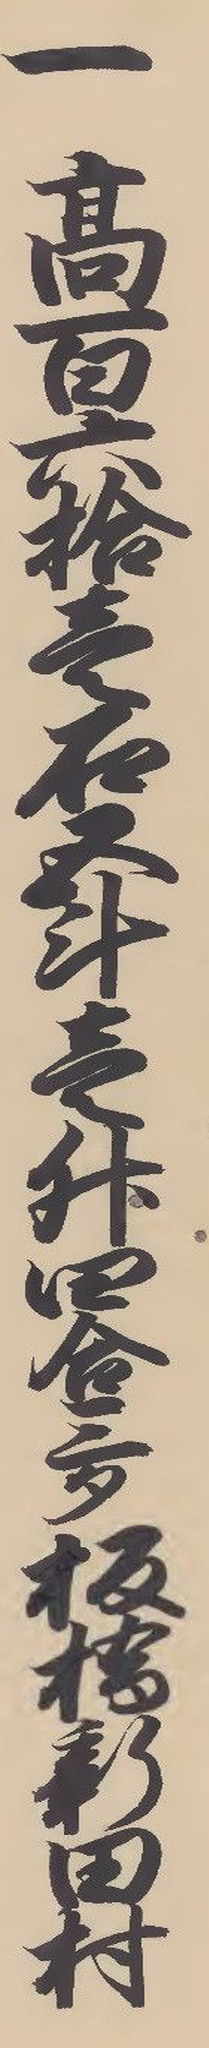一高百六拾壱石五斗壱升四合三勺板橋新田村
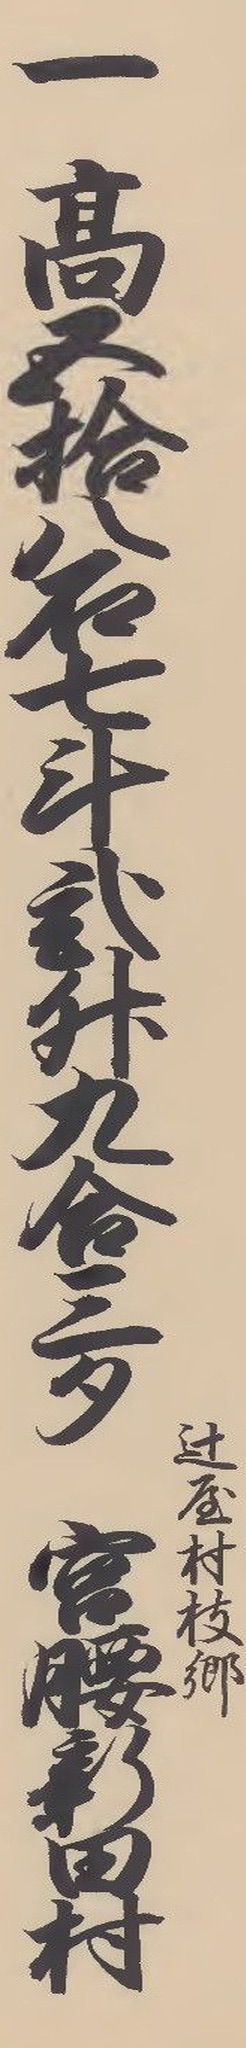一高五拾八石七斗弐升九合三勺宮腰新田村
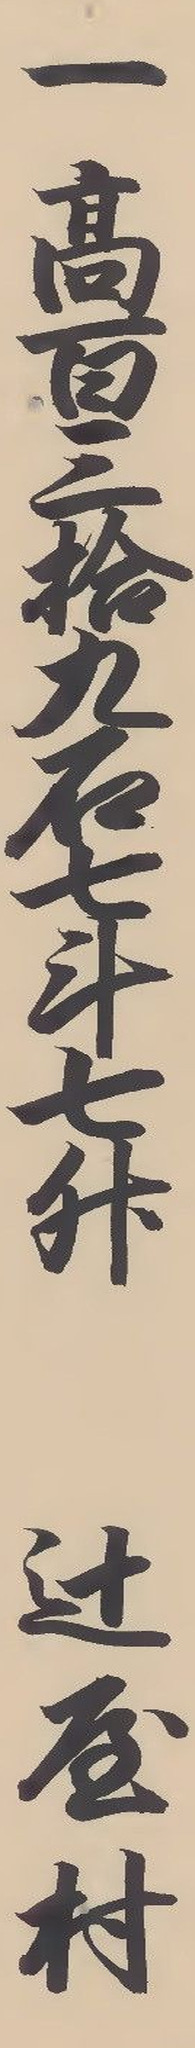一高百三拾九石七斗七升辻屋村
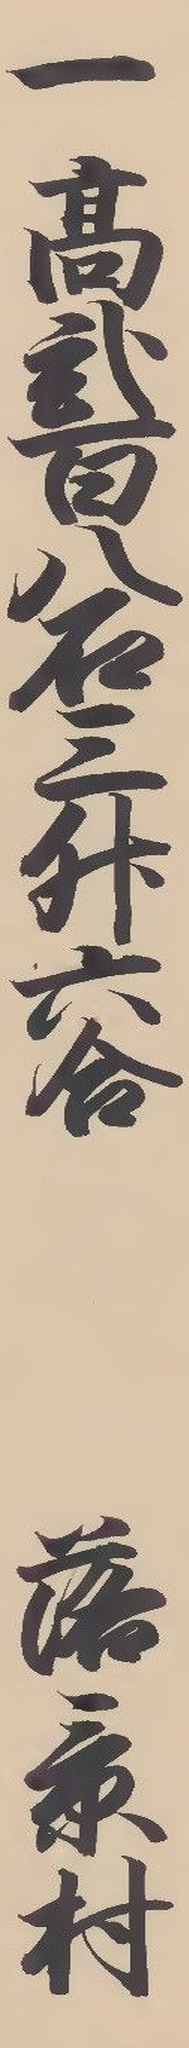一高弐百八石三升六合落景村
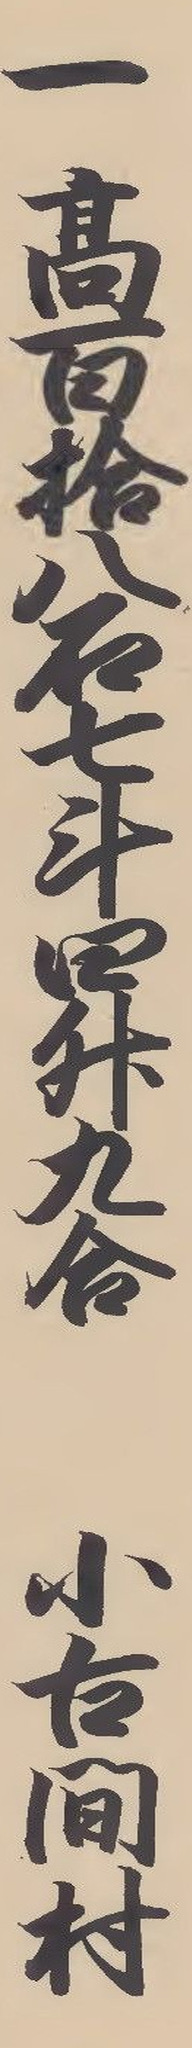一高百拾八石七斗四升九合小古間村
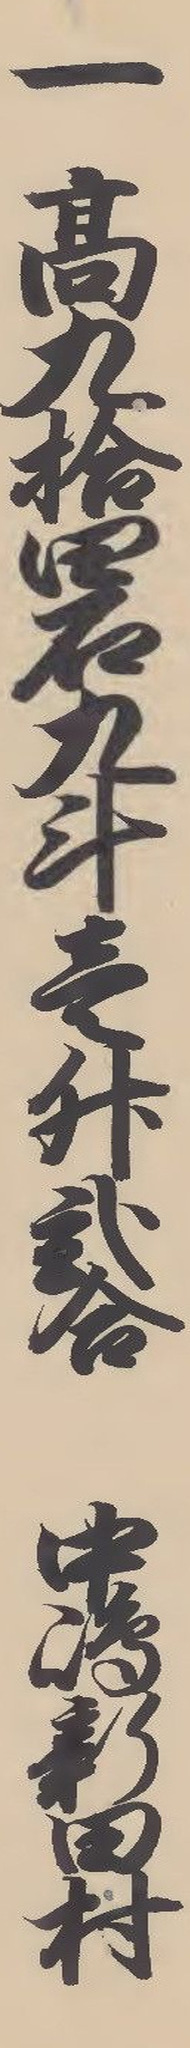一高九拾四石九斗壱升弐合中島新田村
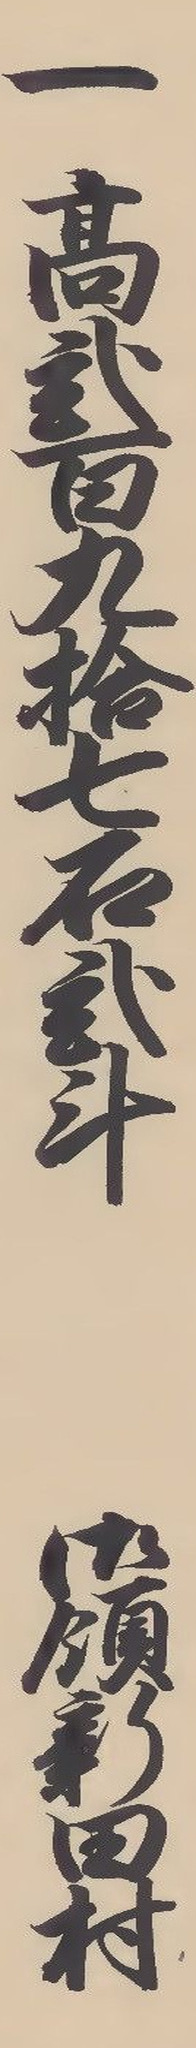一高弐百九拾七石弐斗御領新田村
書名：信濃国郷帳
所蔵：国立公文書館 National Archives of Japan
